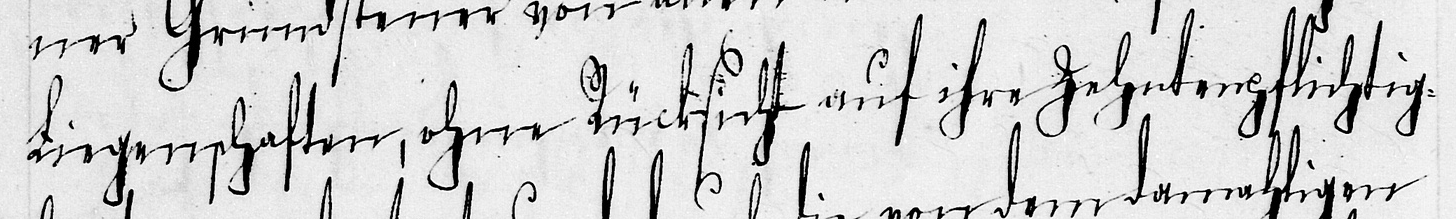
Liegenschaften, ohne Rücksicht auf ihre Zehntenpflichti¬
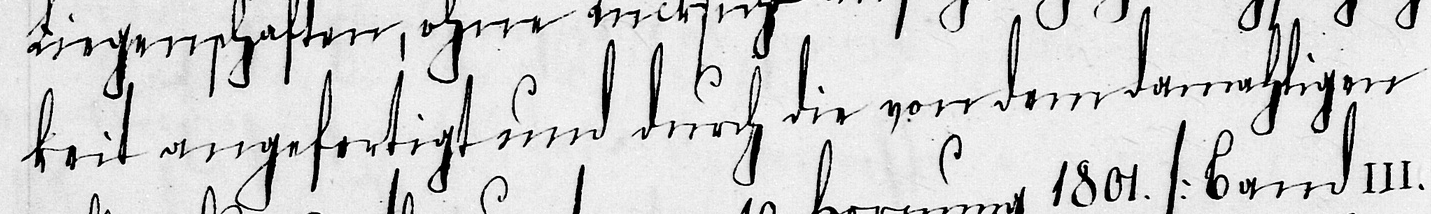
gkeit angefertigt und durch die von dem damahligen
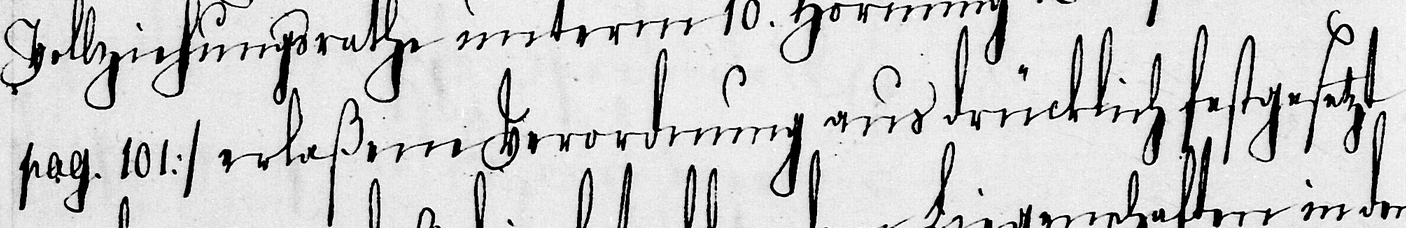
pag 101] erlaßene Verordnung ausdrücklich festgesetzt
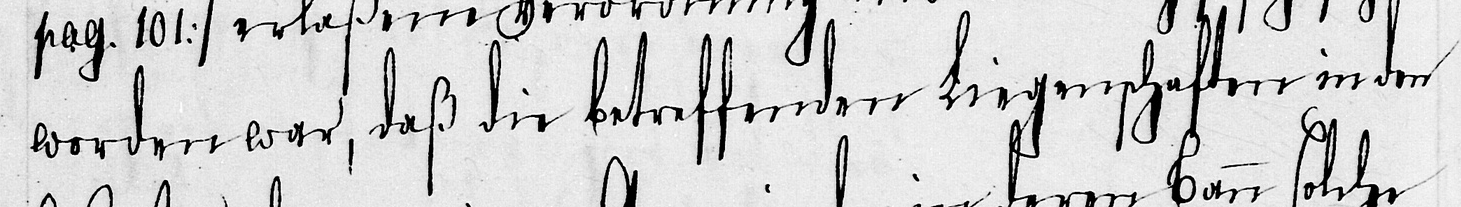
worden war, daß die betreffenden Liegenschaften in den
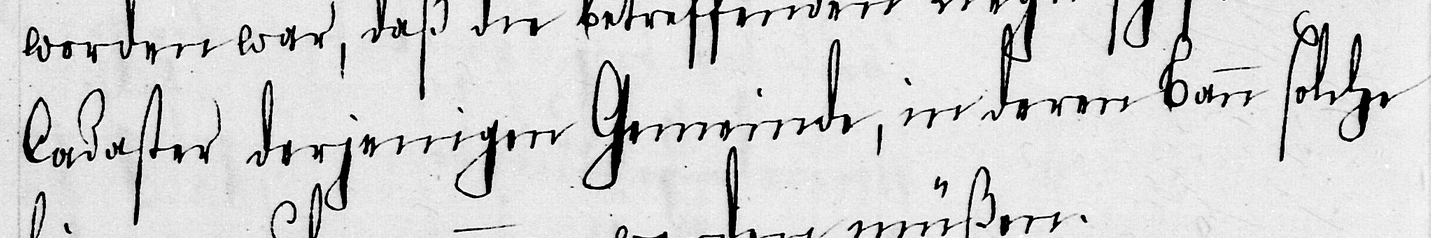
Cadaster derjenigen Gemeinde, in deren Bann solche
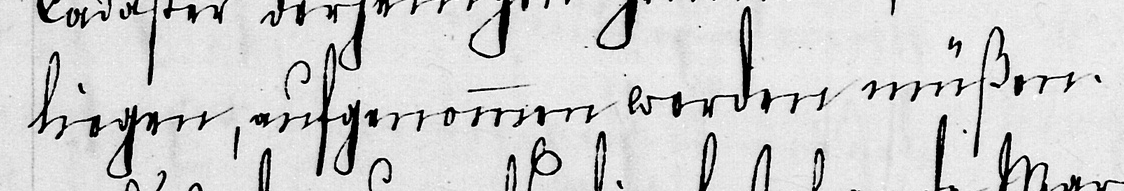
liegen aufgenommen werden müßen.
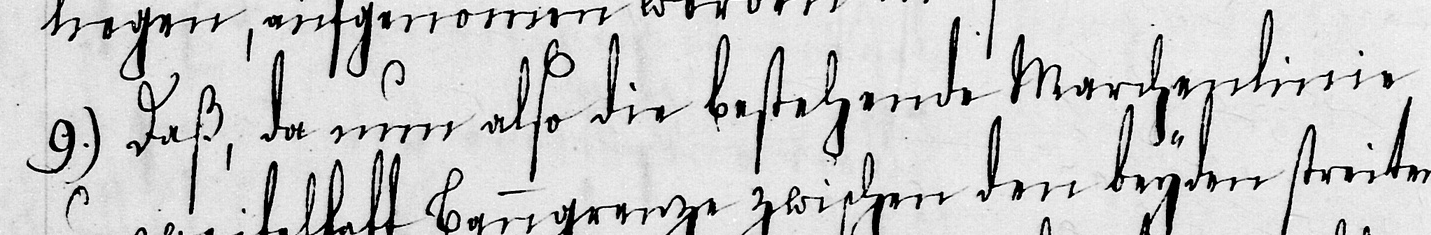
9.) Daß, da nun also die bestehende Marchenlinie
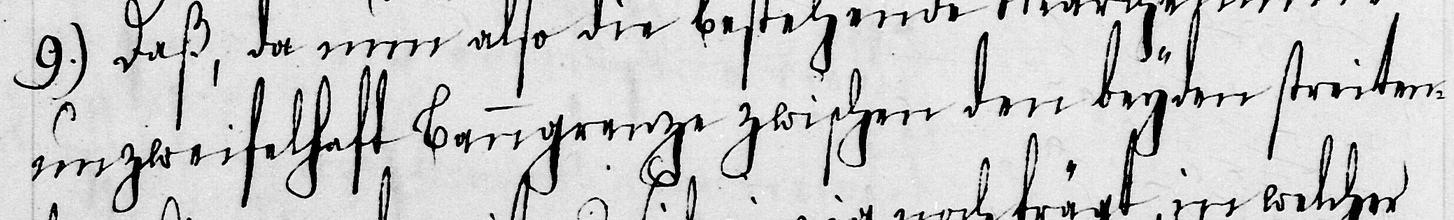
unzweifelhaft Banngrenze zwischen den beyden streiten¬
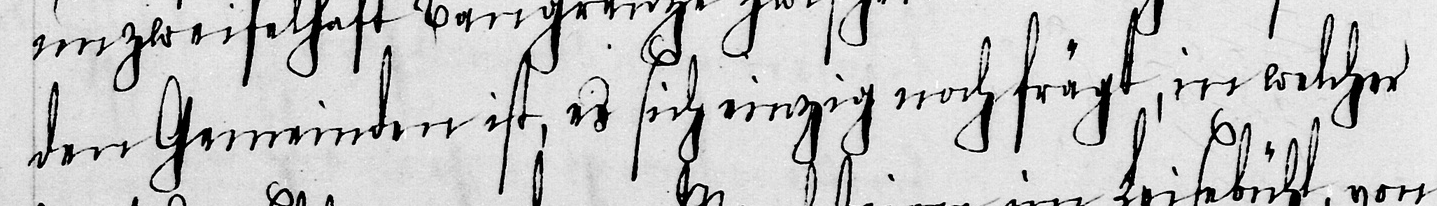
den Gemeinden ist, es sich einzig noch frägt, in welcher
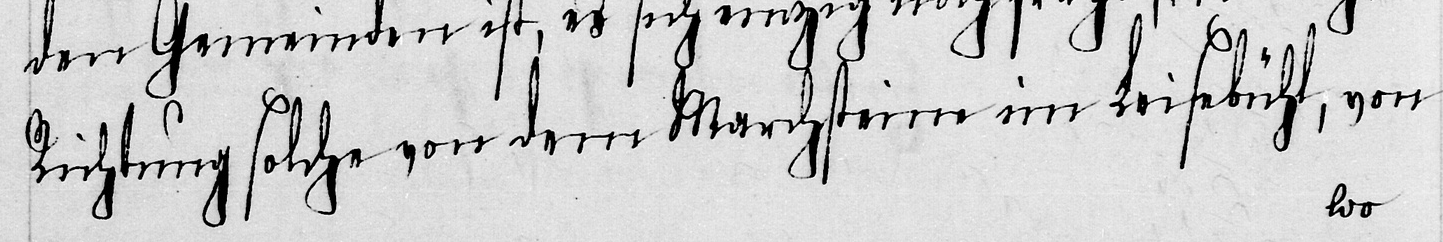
Richtung solche von dem Marchsteine im Leisebühl, von
